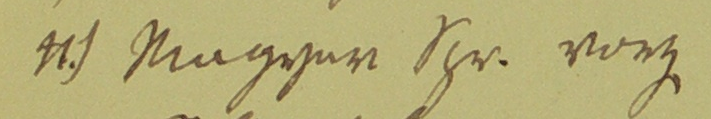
11. Magyarische Sprache vorzüglich
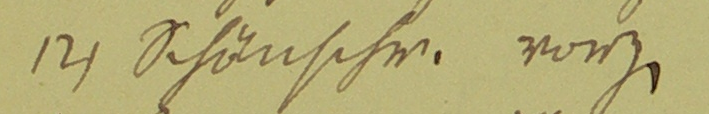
12. Schönschreiben vorzüglich
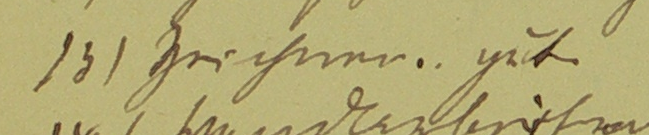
13. Zeichnen gut
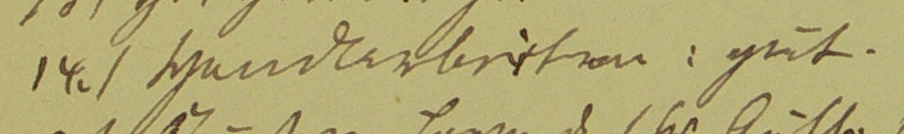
14. Handarbeiten gut
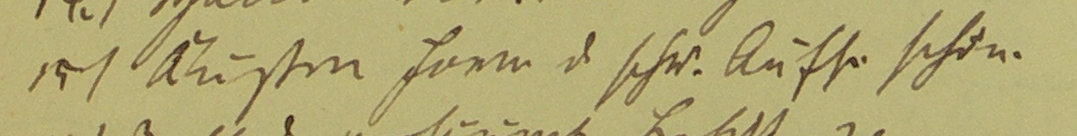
15. Äußere Form der schriftl. Aufs: schön
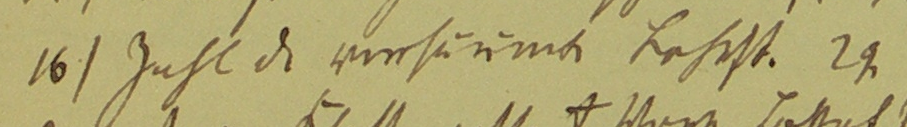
16. Zahl der versäumten Lehrst. 29
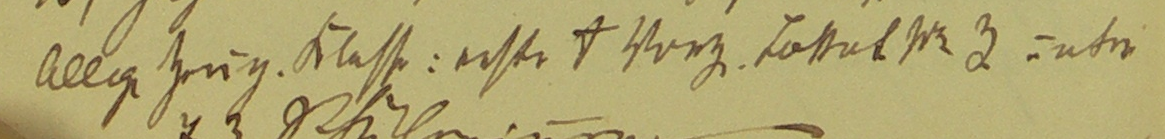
Allg. Zug. Klasse, : erste mit Vorz. Lokat.Nr. 3 von
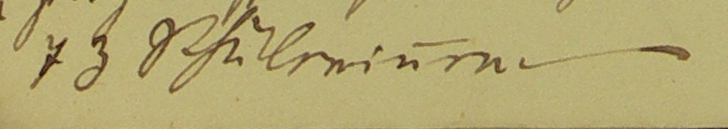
73 Schülerinnen.--
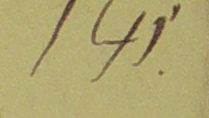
141
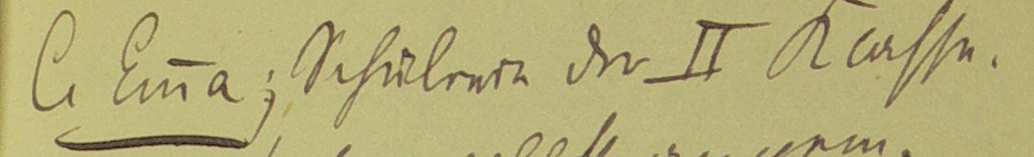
C. Emma… Schülerin der II Klasse.
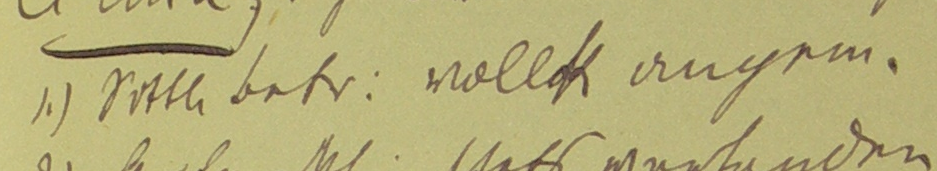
1. Sittl. Betragen vollk. angemessen
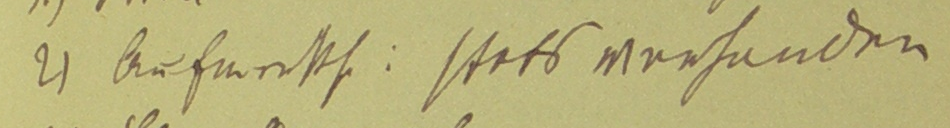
2. Aufmerks: t stets vorhanden
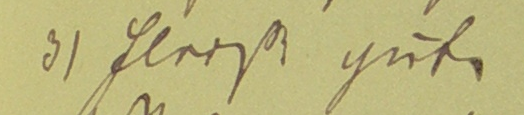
3. Fleiß gut
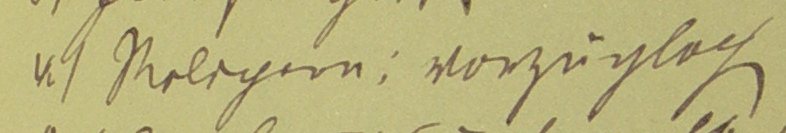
4.Religion vorzüglich
